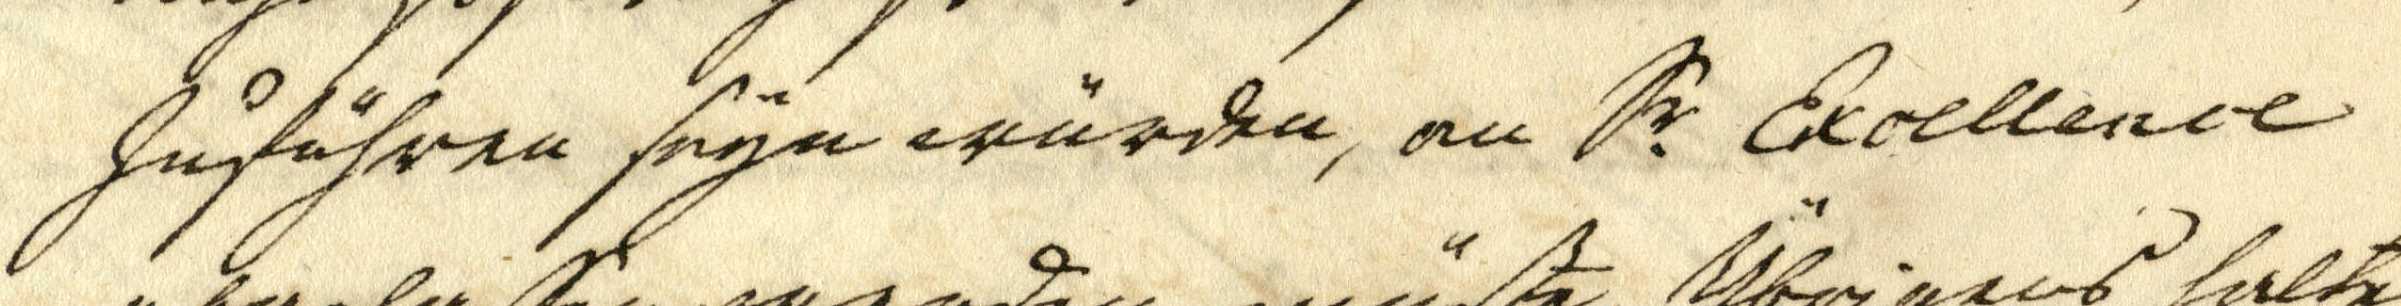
zuführen seÿn würden, an Sr Excellence
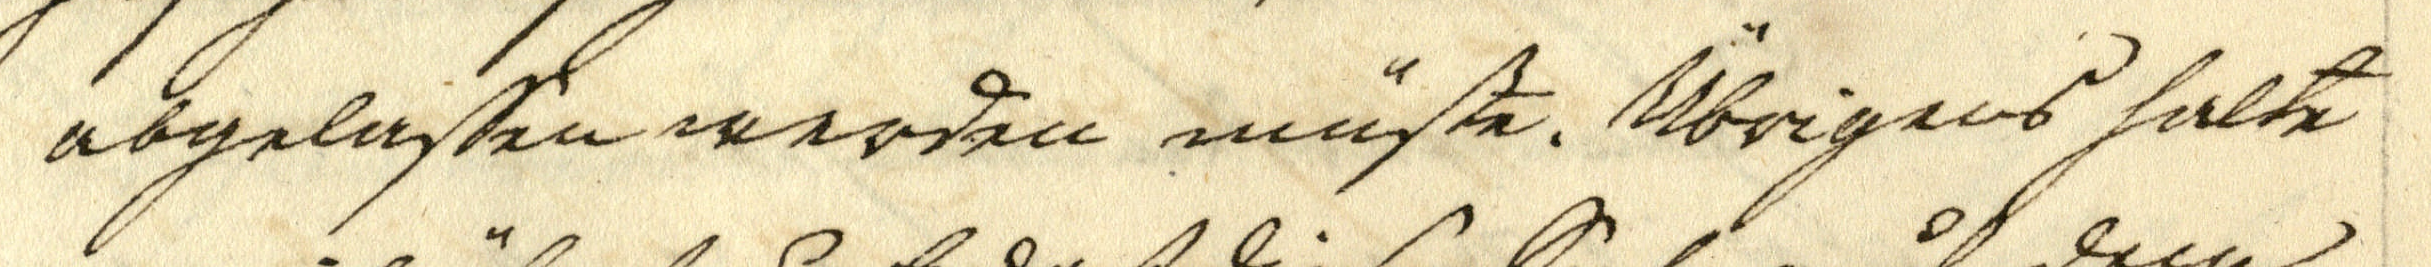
abgelassen werden müßte. Übrigens halte
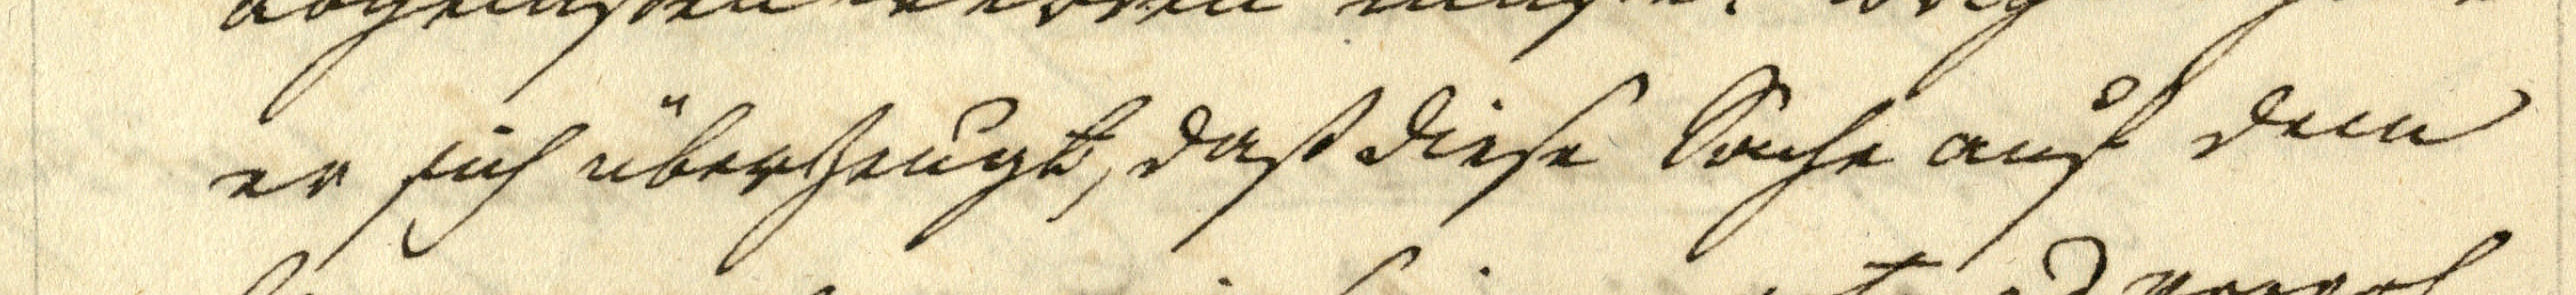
er sich überzeugt, daß diese Sache auf dem
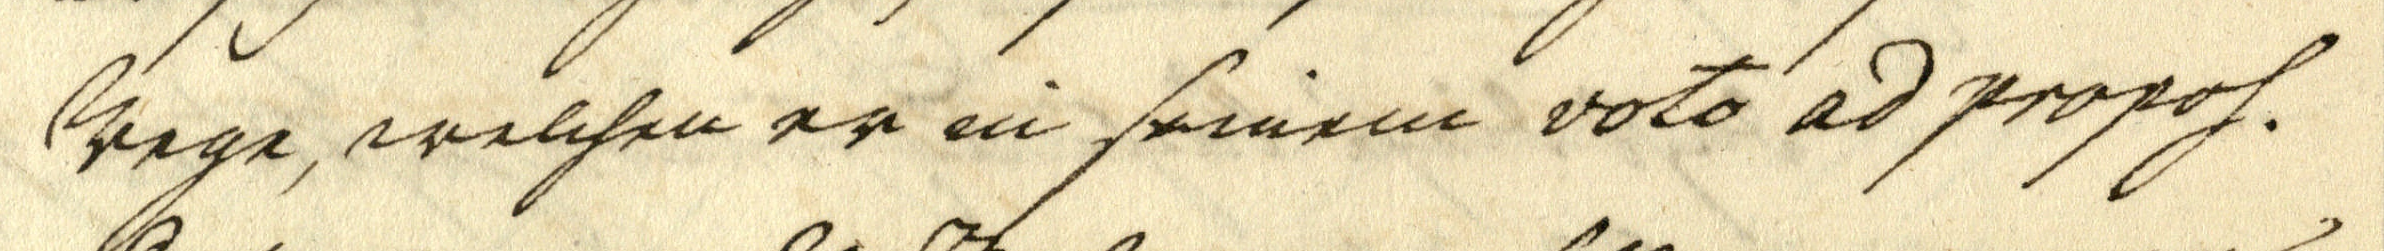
Wege, welchen er in seinem voto ad propos.
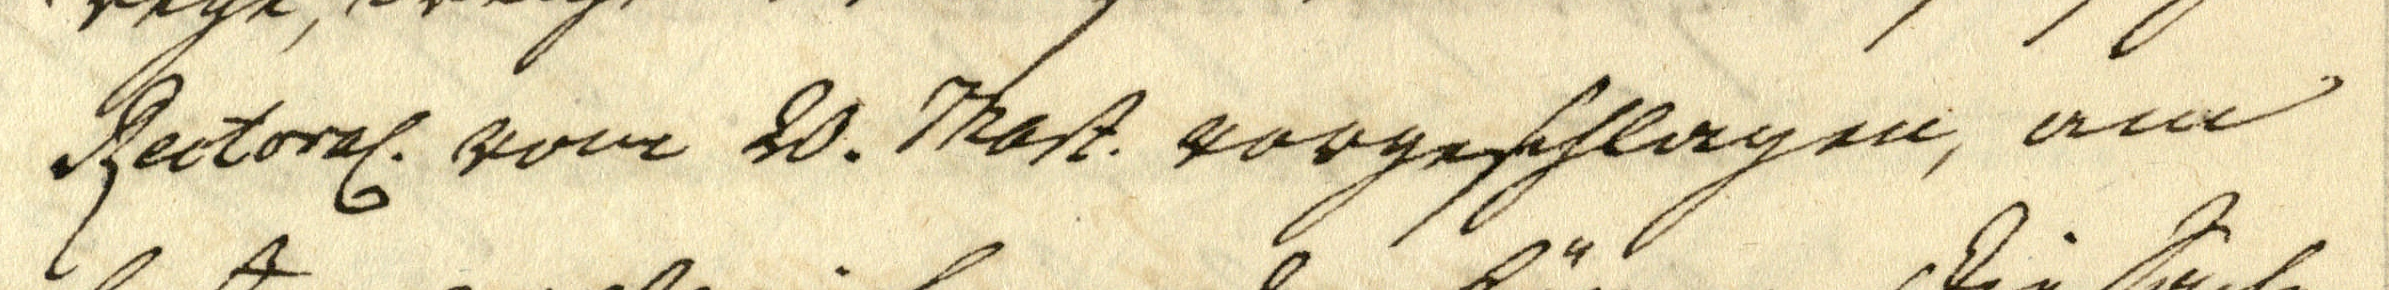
Rectoral. vom 20. Mart. vorgeschlagen, am
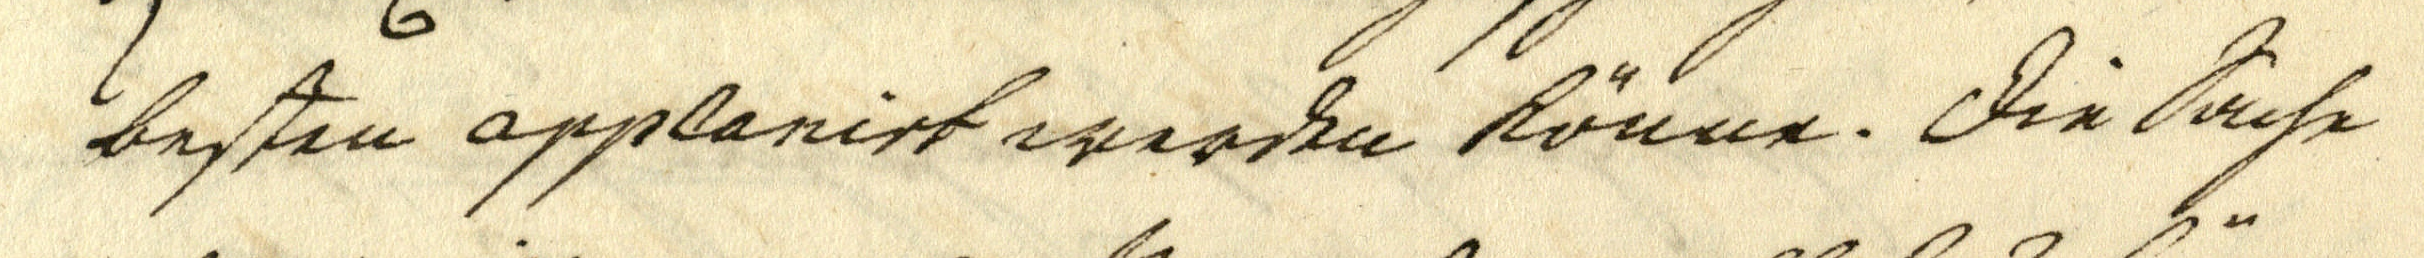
besten applanirt werden könne. Die Sache
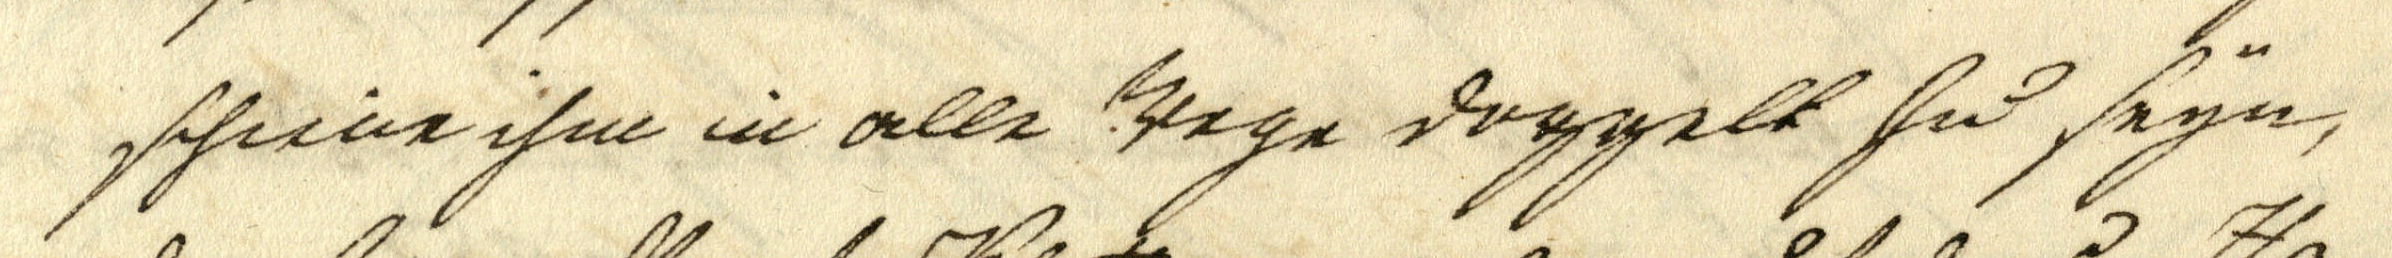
schiene ihm in alle Wege doppelt zu seÿn,
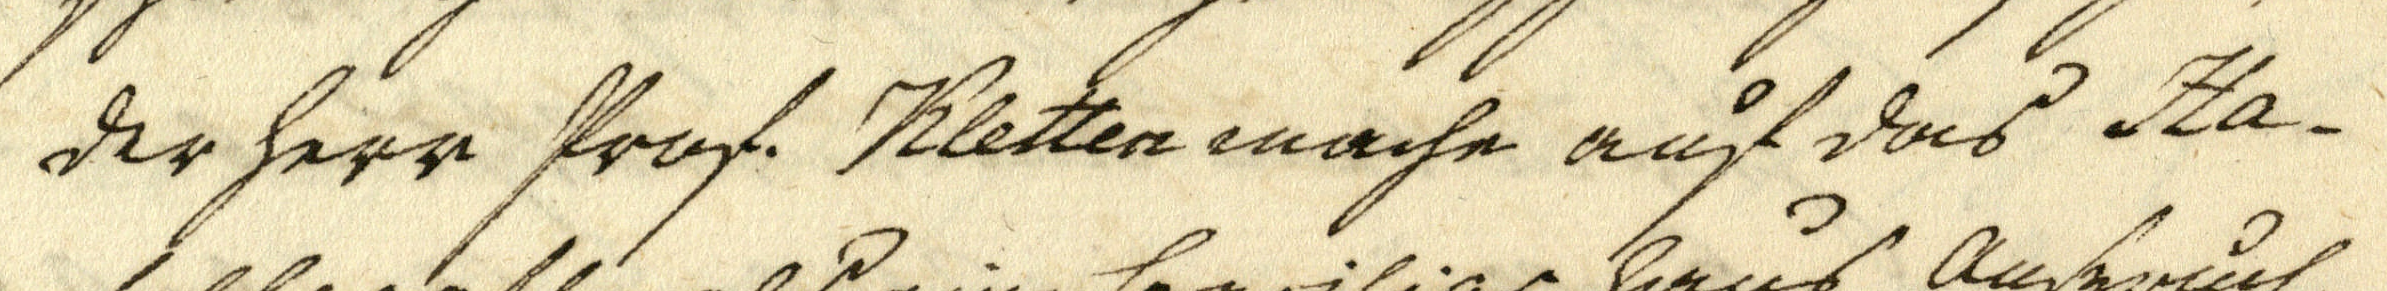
der Herr Prof. Kletten mache auf das Ha¬
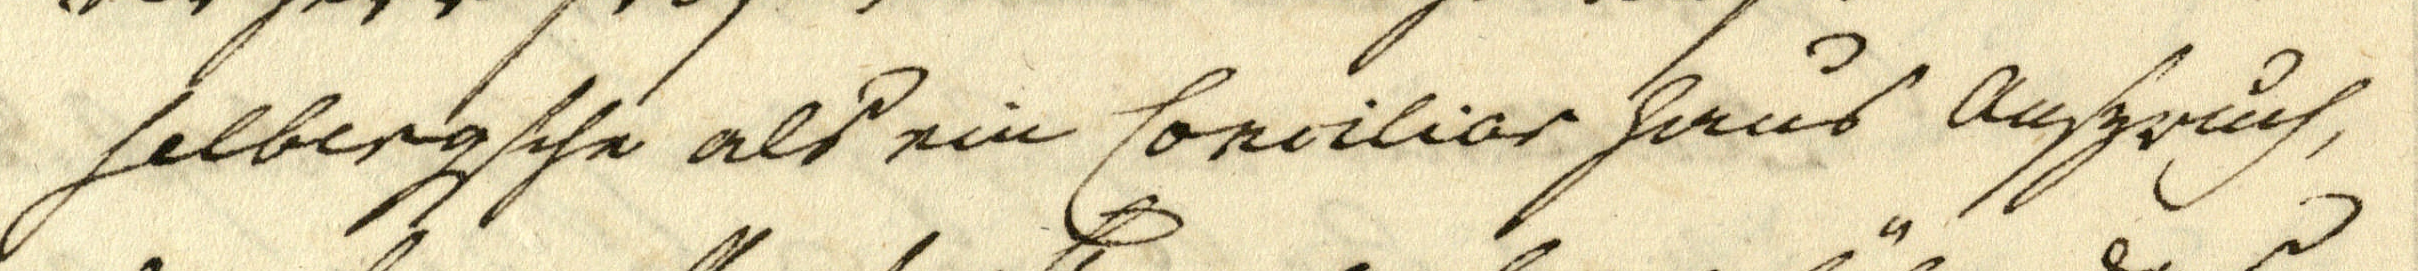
selbergsche als ein Conciliar Haus Anspruch,
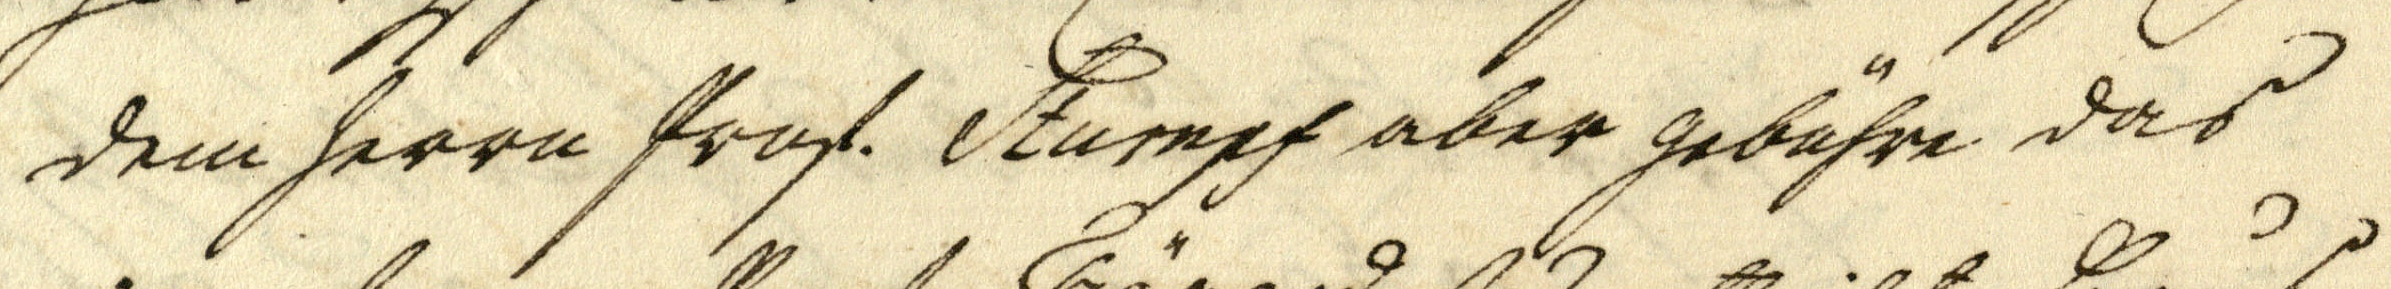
dem Herrn Prof. Stumpf aber gebühre das
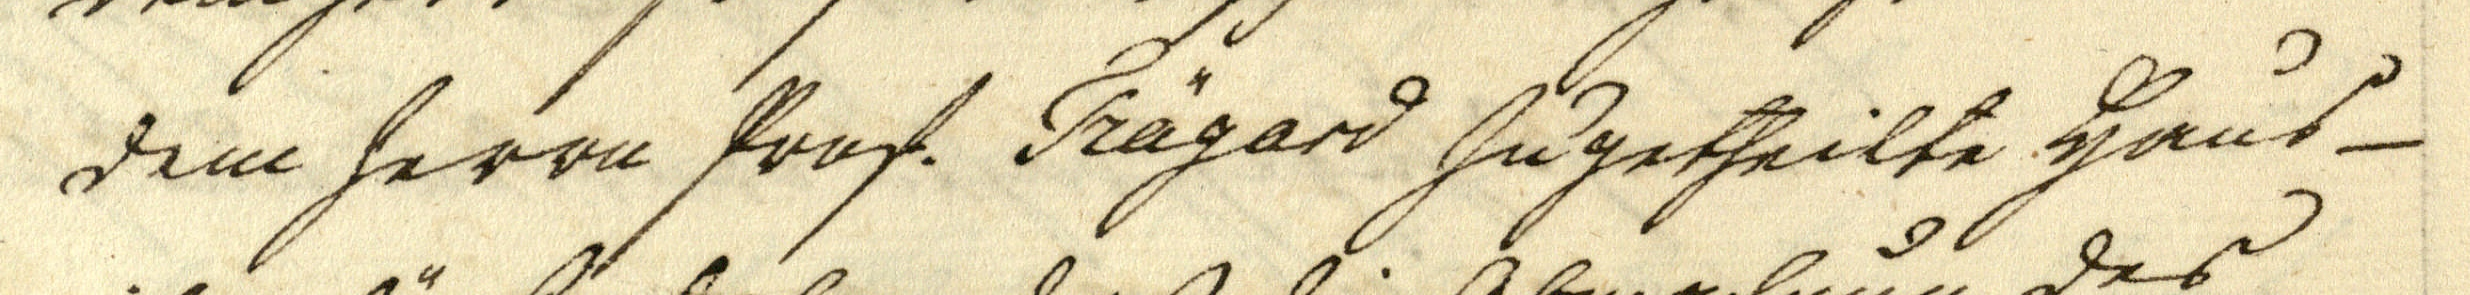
dem Herrn Prof. Trägård zugetheilte Haus -
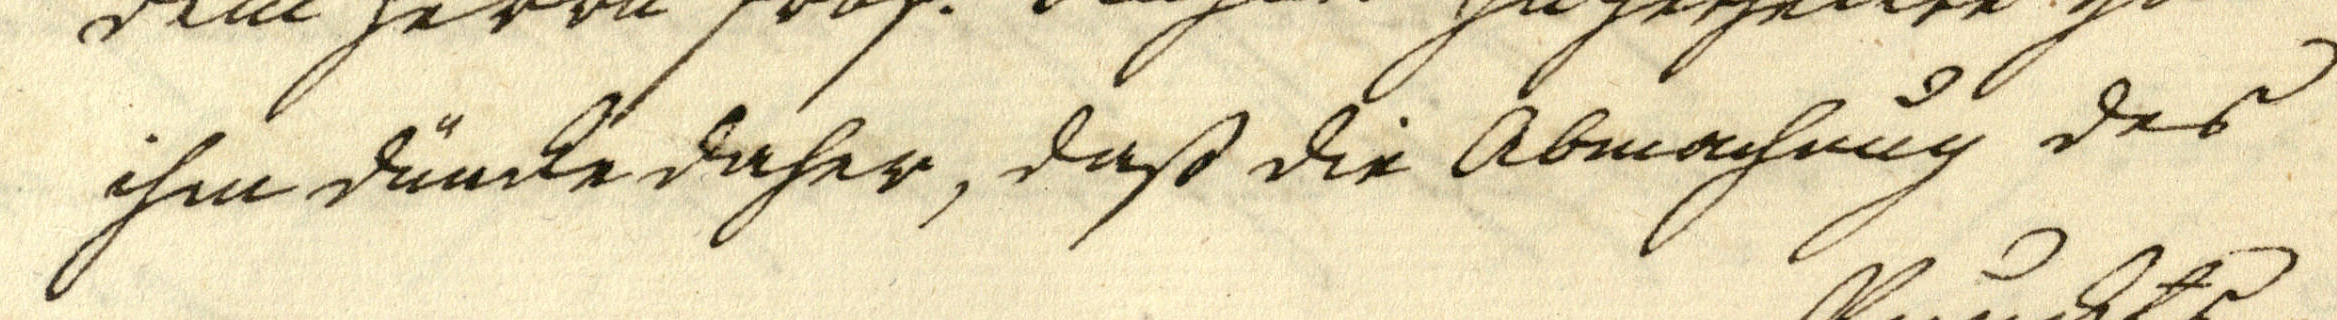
ihm düncke daher, daß die Abmachung des
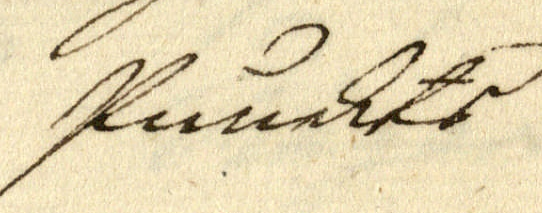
Punckts
